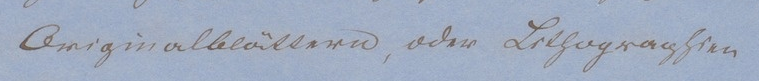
Originalblättern, oder Lithographien
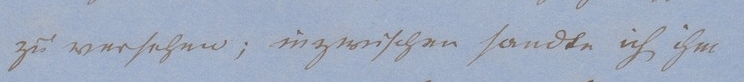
zu versehen; inzwischen sandte ich ihm
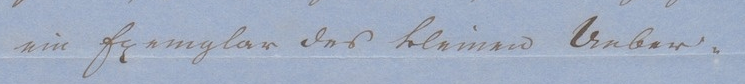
ein Exemplar des kleinen Ueber-
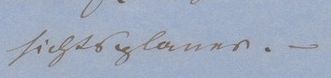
sichtsplanes. –
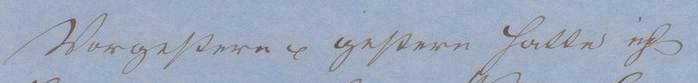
Vorgestern & gestern hatte ich
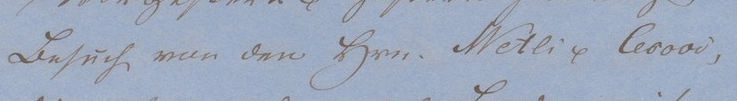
Besuch von den Hrn. Wetli & Cecovi,
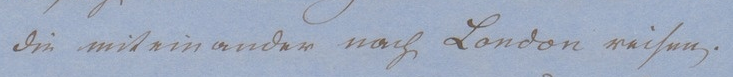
die miteinander nach London reisen.
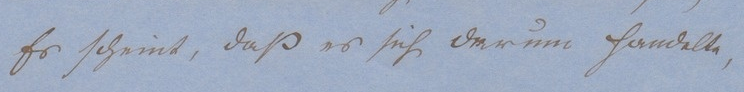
Es scheint, daß es sich darum handelte,
